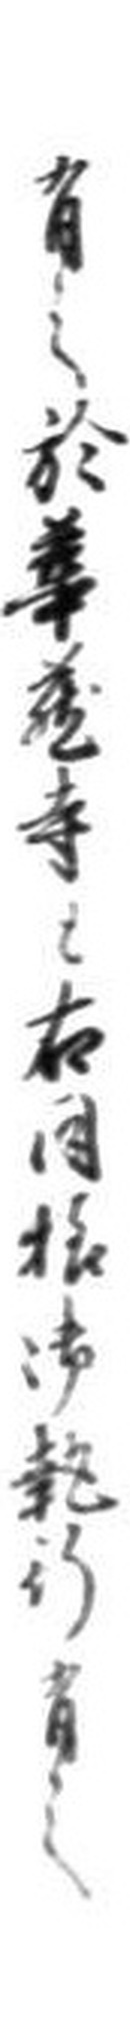有之於華蔵寺も右同様御執行有之
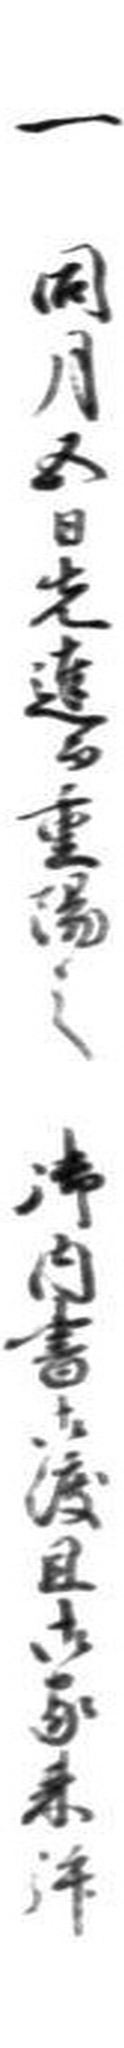一同月五日先達而重陽之御内書御渡且御家来拝
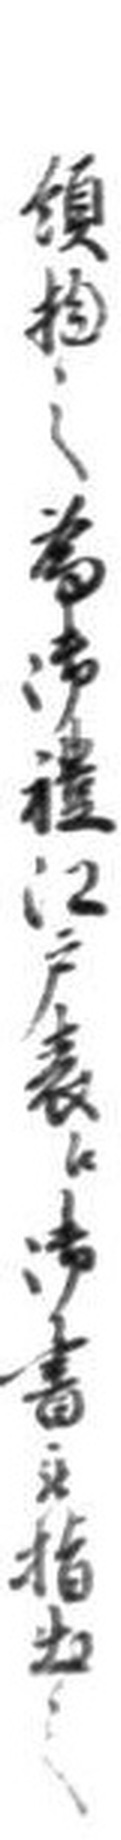領物之為御礼江戸表江御書被指出之
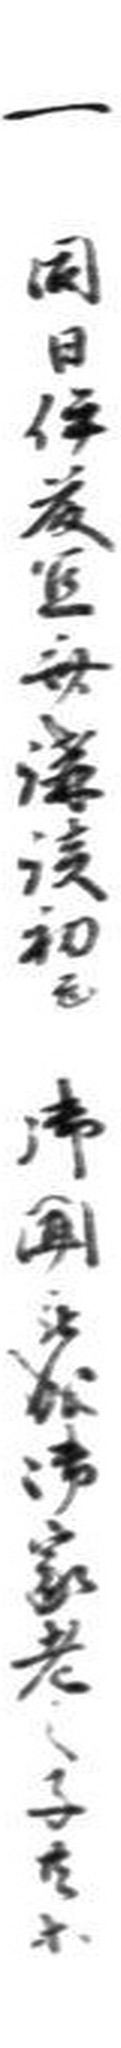一同日伊藤宜斎講談初而御聞被成御家老之子共等
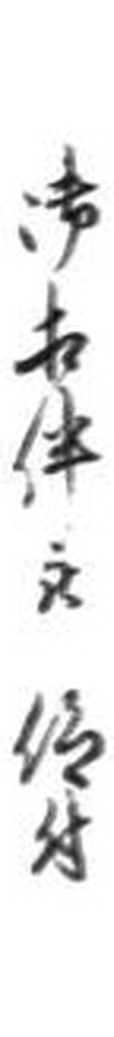御相伴被仰付

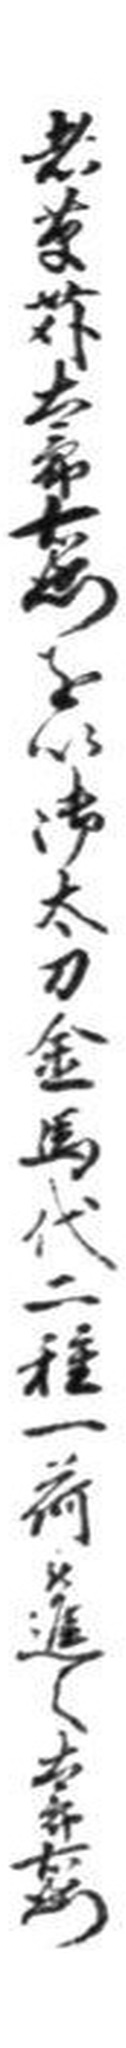者草苅太郎右衛門を以御太刀金馬代二種一荷被進之太郎右衛門
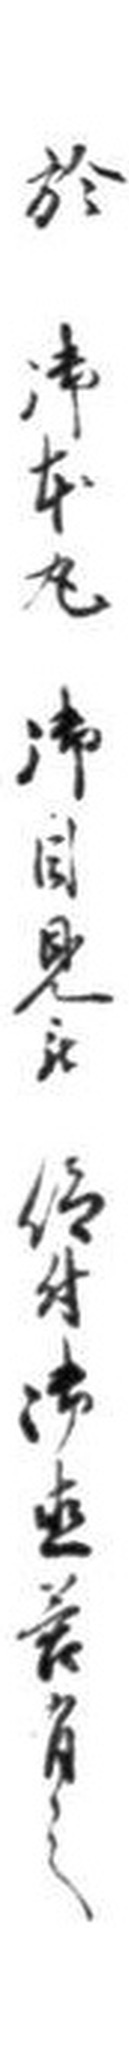於御本丸御目見被仰付御直答有之
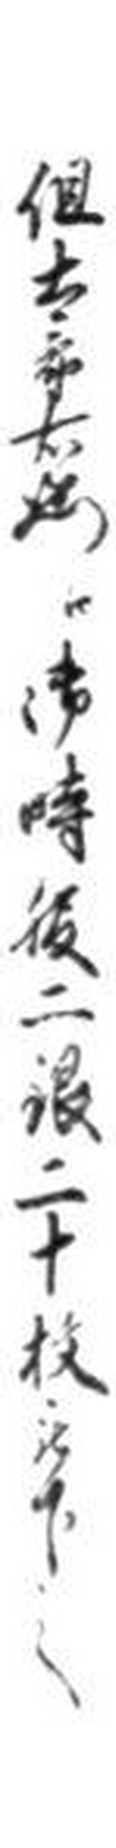但太郎右衛門江御時服二銀二十枚被下之
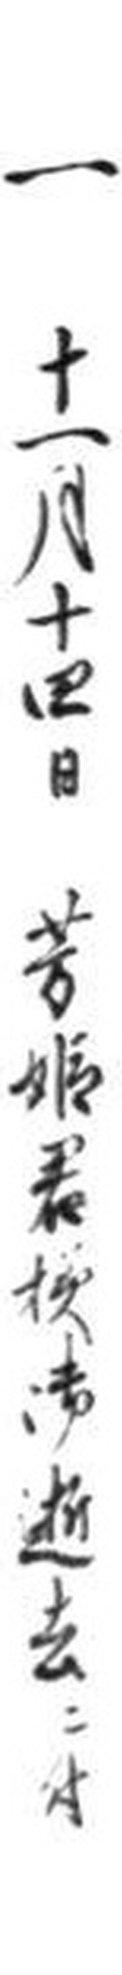一十一月十四日芳姫君様御逝去ニ付
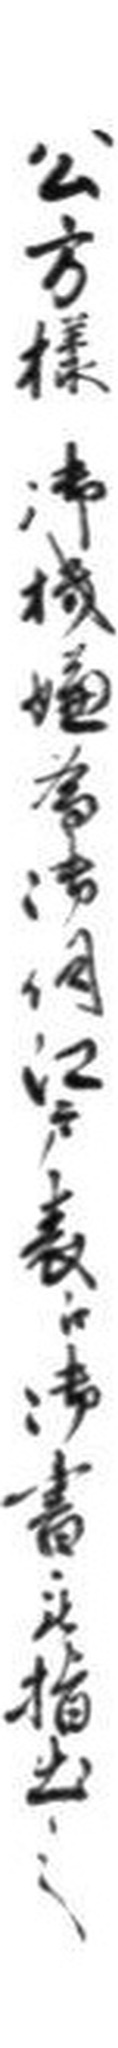公方様御機嫌為御伺江戸表江御書被指出之
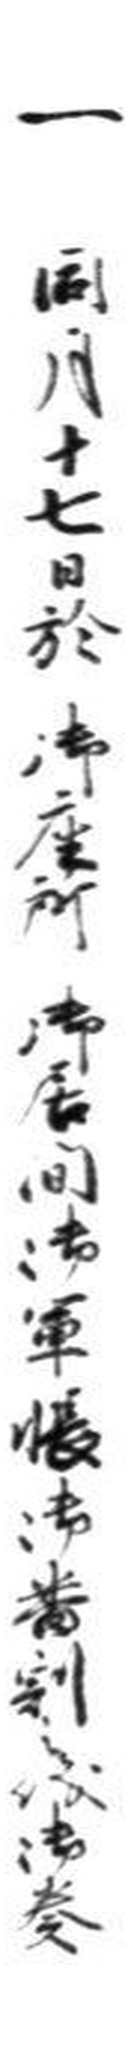一同月十七日於御座所御居間御軍帳御番割之儀御奏
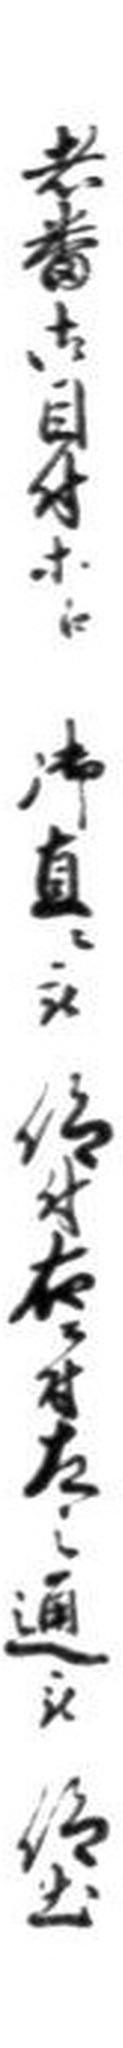者番御目付等江御直ニ被仰付右ニ付左之通被仰出
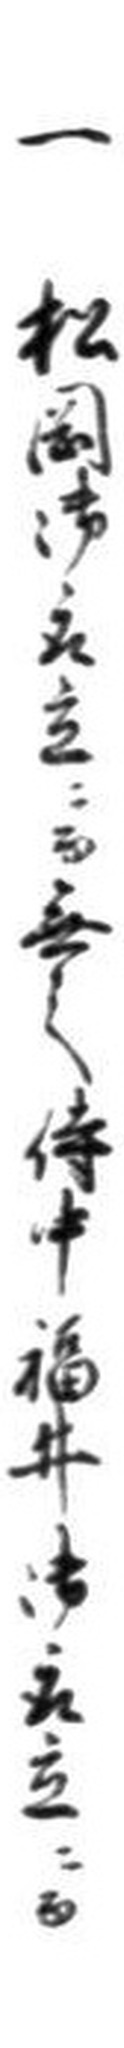一松岡御取立ニ而無之侍中福井御取立ニ而
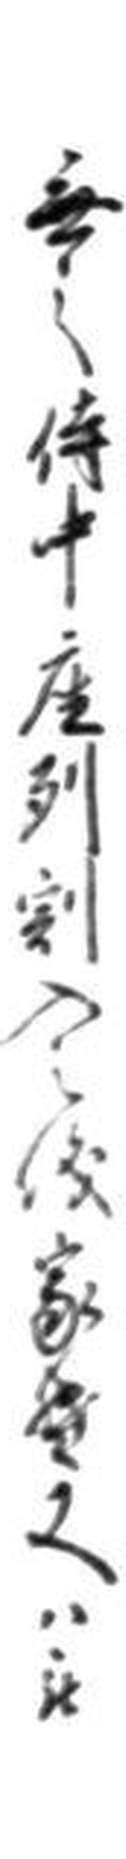無之侍中座列割入之儀家督又ハ被
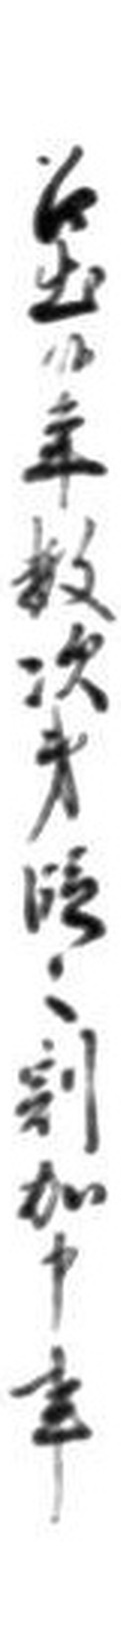召出候年数次第段々割加申事
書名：家譜 三十五 宗昌公 従享保六年到同七年
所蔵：福井県文書館 Fukui Prefectural Archives
